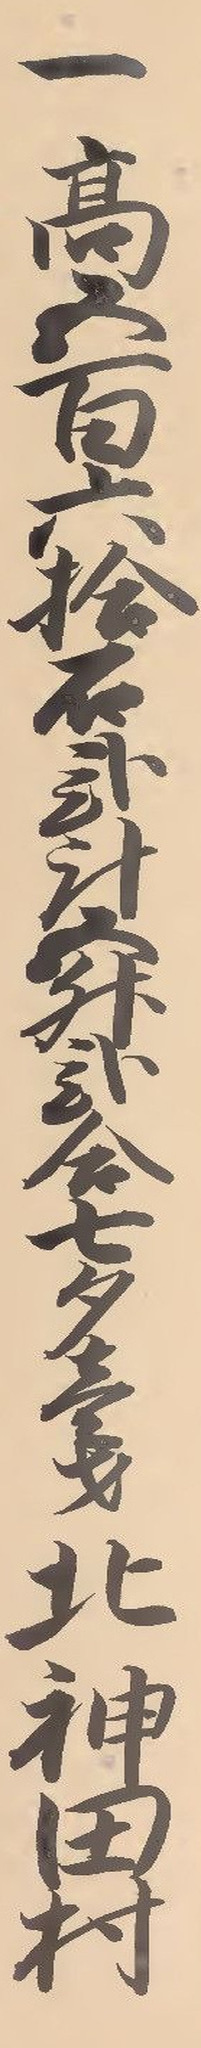一高五百六拾石弐斗五升弐合七勺壱才北神田村
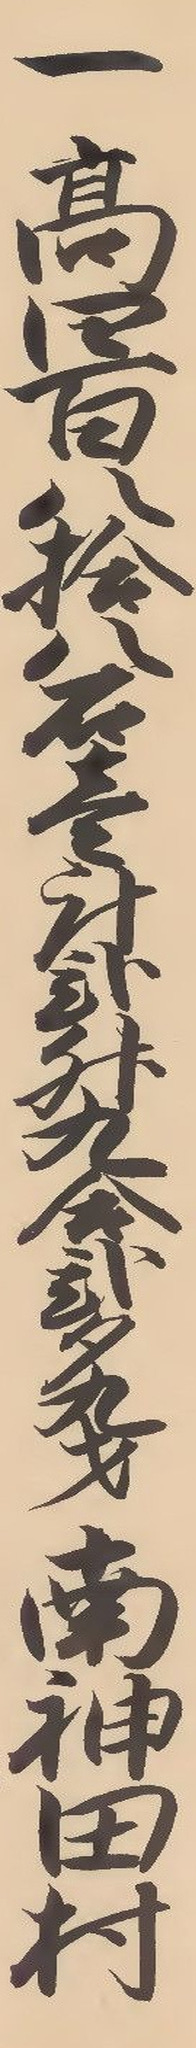一高四百八拾八石壱斗弐升九合弐勺九才南神田村
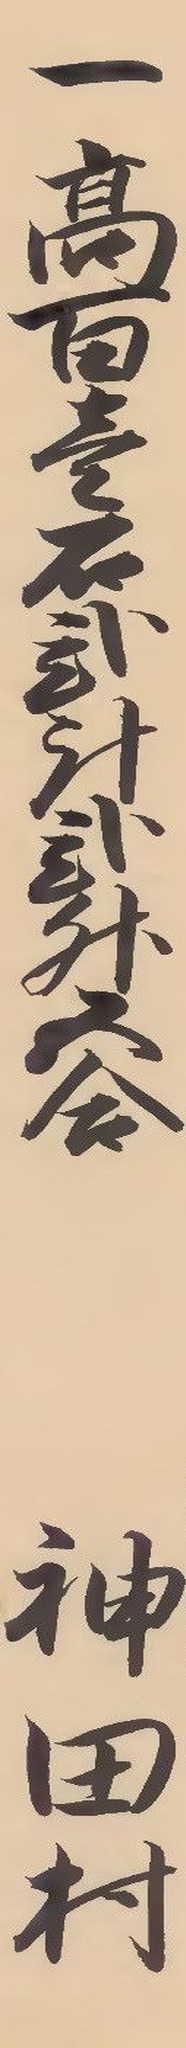一高百壱石弐斗弐升五合神田村
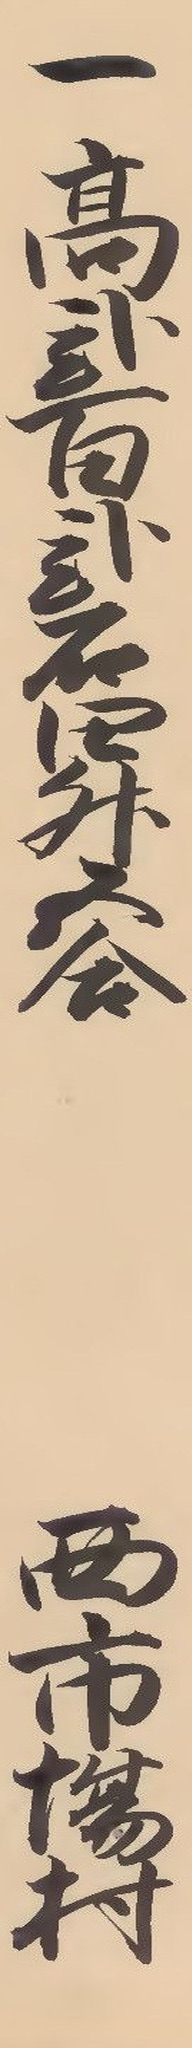一高弐百弐石四升五合西市場村

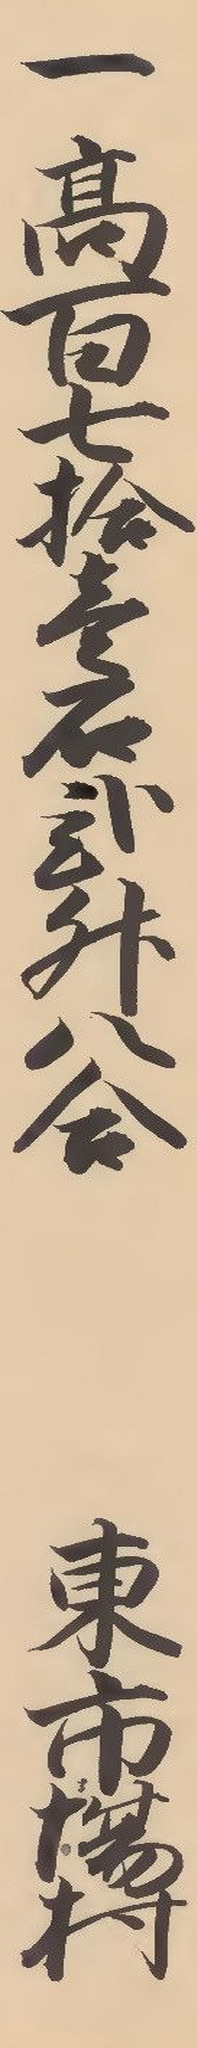一高百七拾壱石弐升八合東市場村
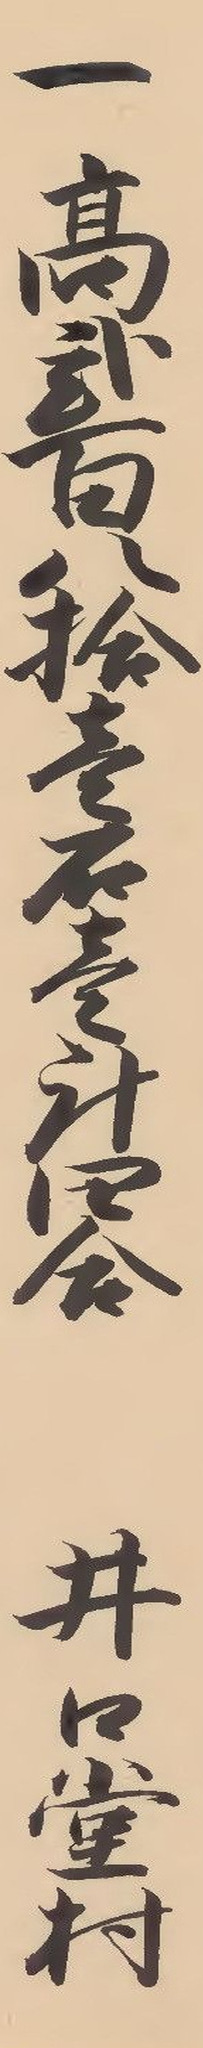一高弐百八拾壱石壱斗四合井口堂村
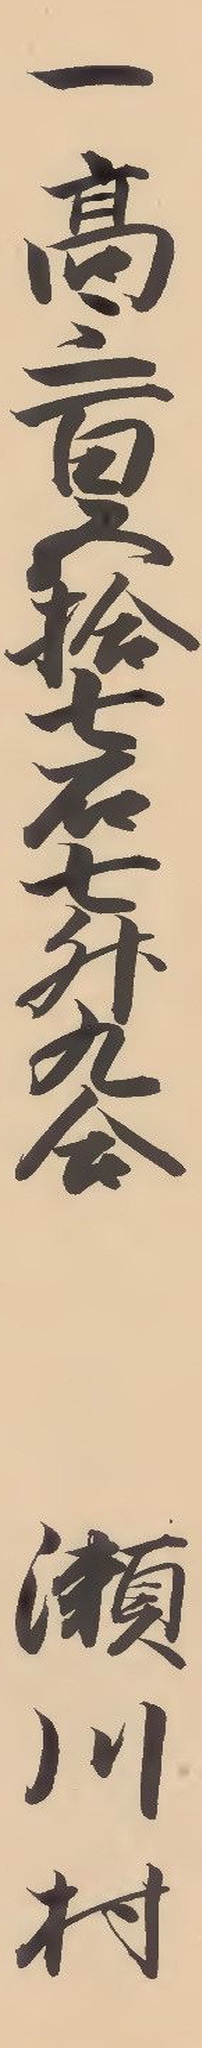一高三百五拾七石七升九合瀬川村
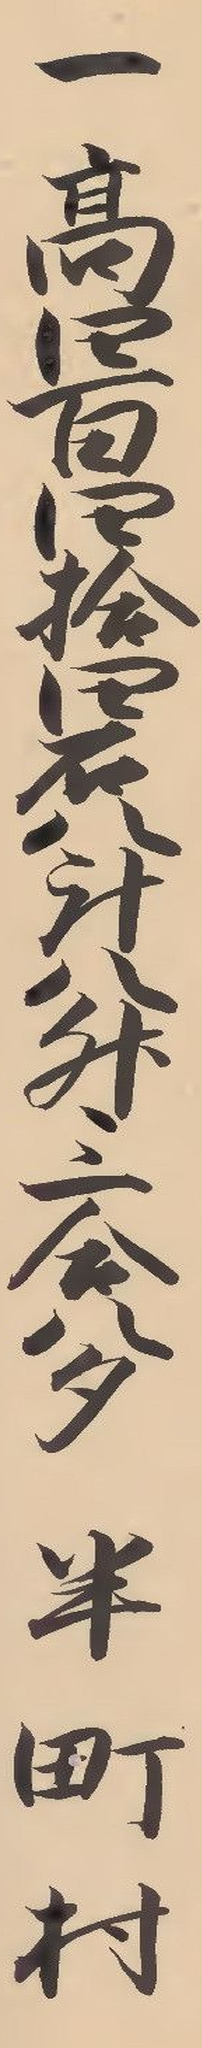一高四百四拾四石八斗八升三合八勺半町村
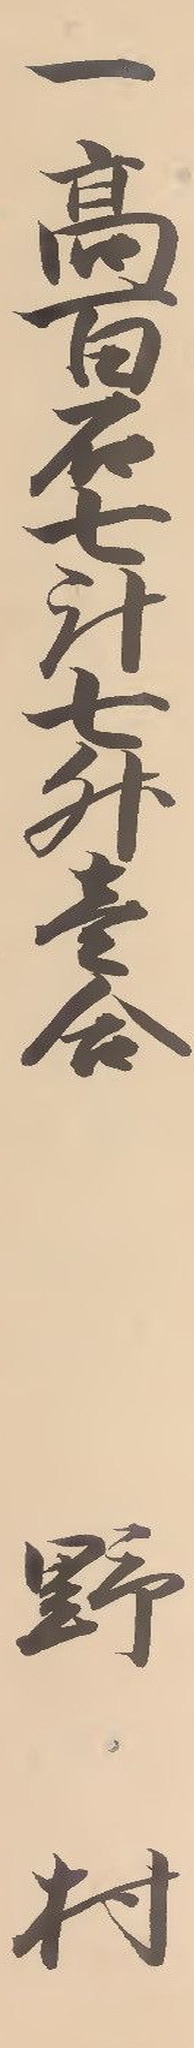一高百石七斗七升壱合野村
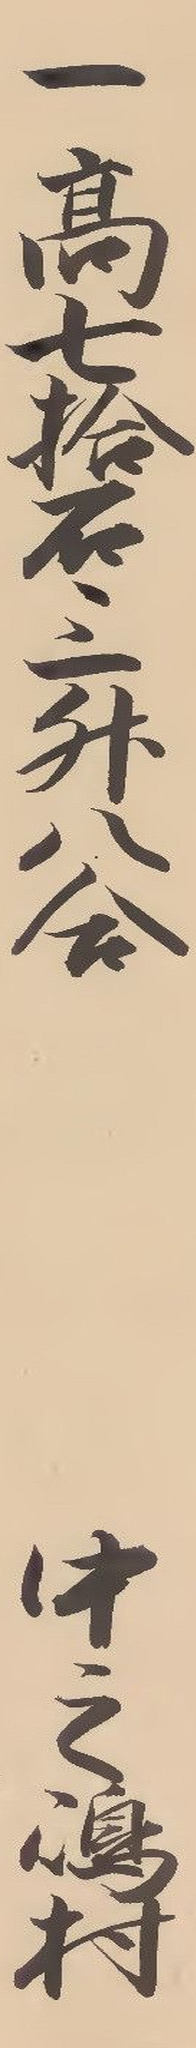一高七拾石三升八合中之島村
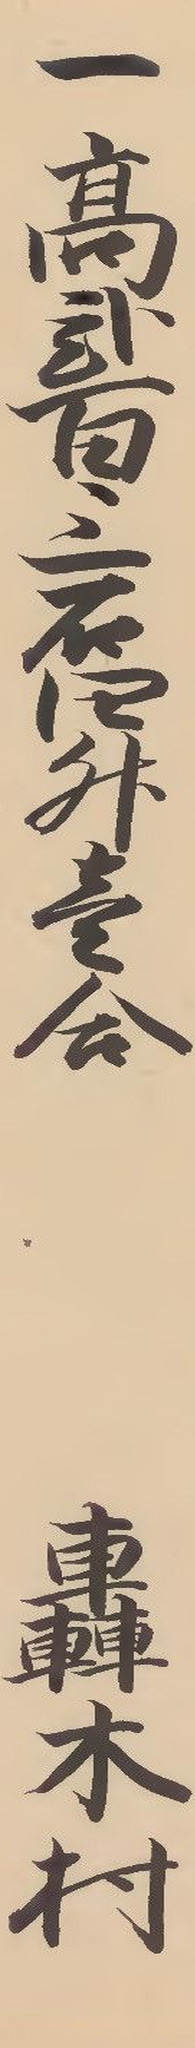一高弐百三石四升壱合轟木村
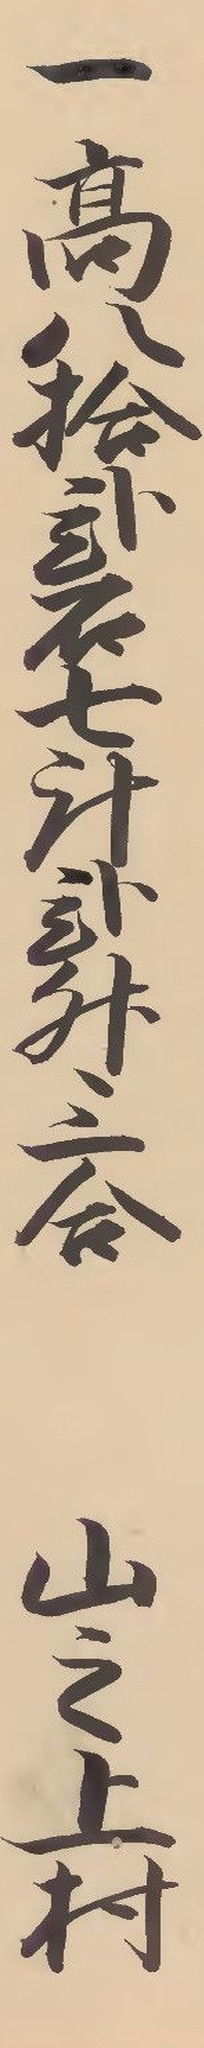一高八拾弐石七斗弐升三合山之上村

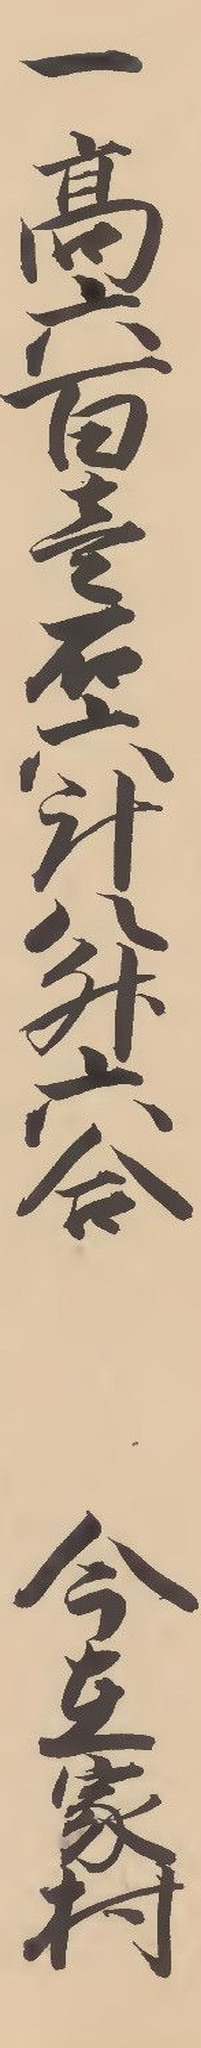一高六百壱石六斗八升六合今在家村
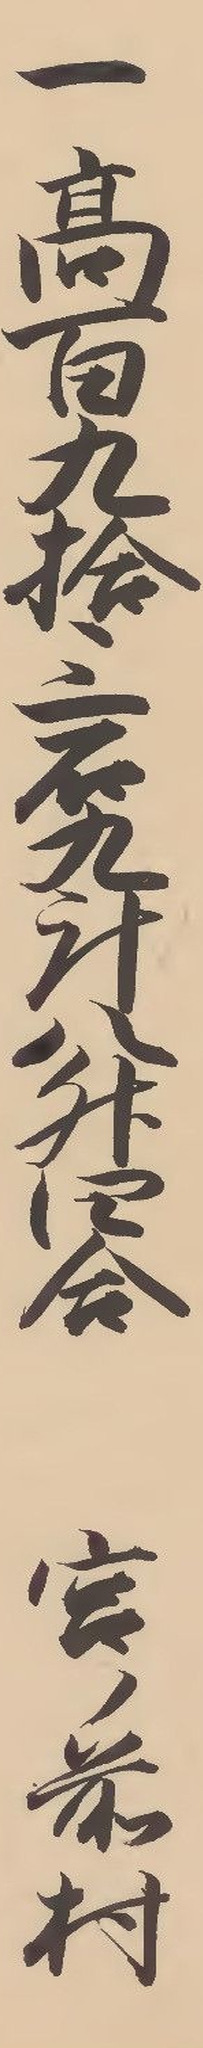一高百九拾三石九斗八升四合宮ノ前村
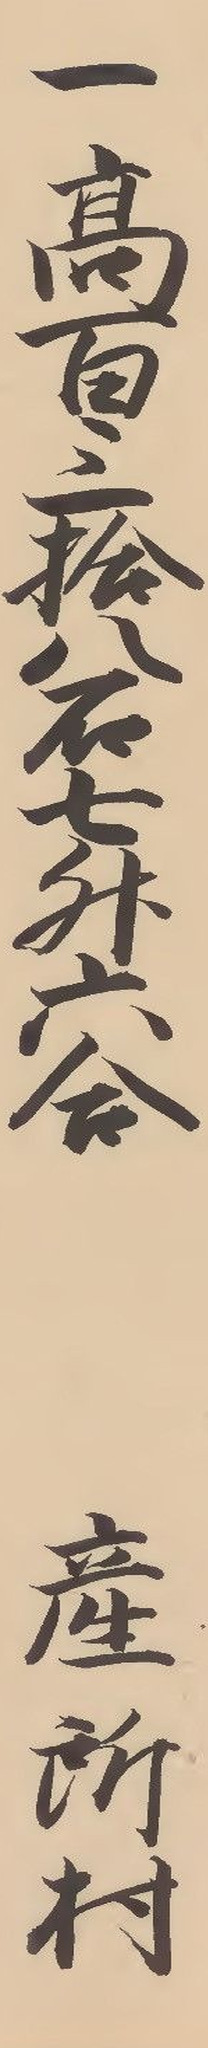一高百三拾八石七升六合産所村
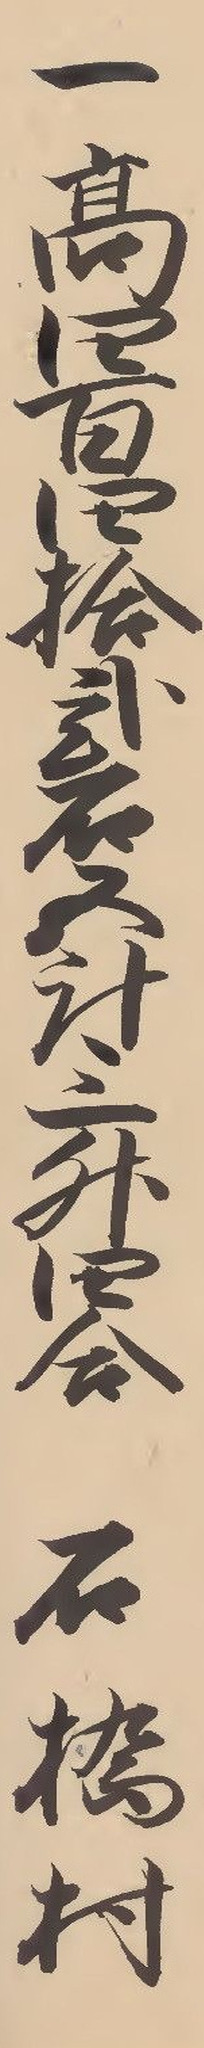一高四百四拾弐石五斗三升四合石橋村
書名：摂津国郷帳
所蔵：国立公文書館 National Archives of Japan
